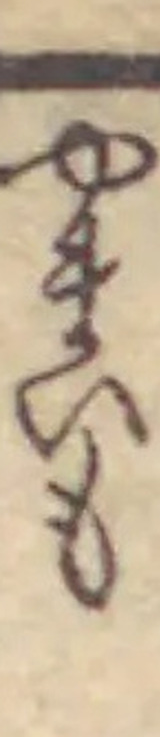やまいも
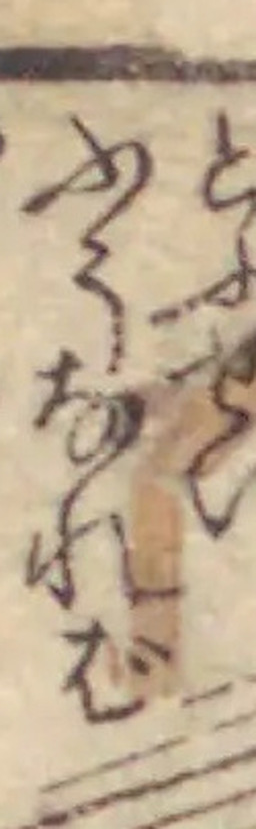ふうなれば
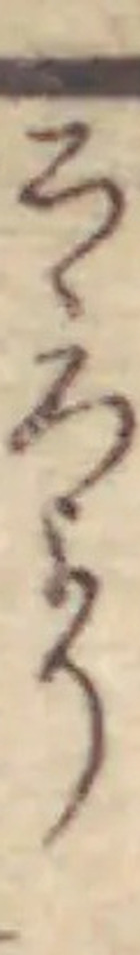こゝろより
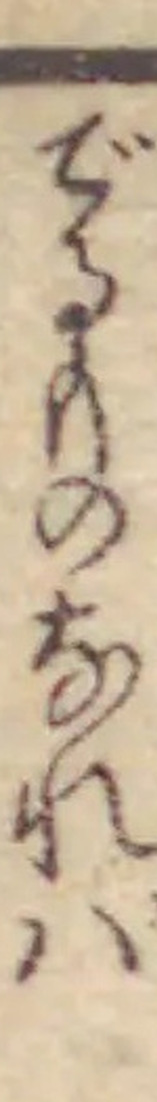でるものなれば
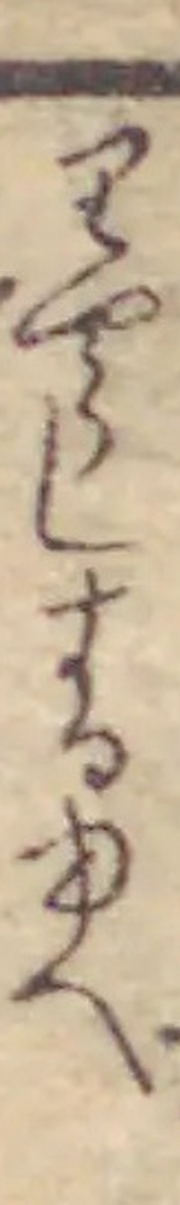りやうしするゆへ
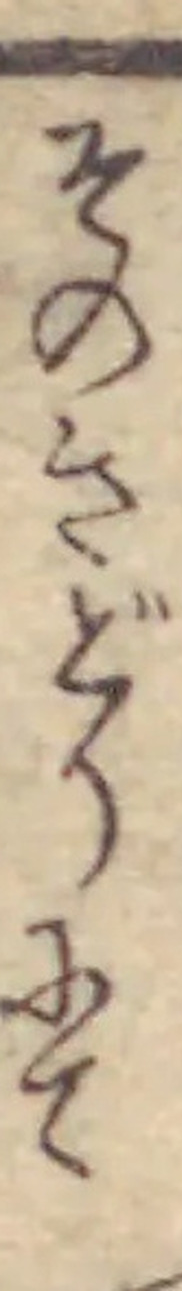そのきどりにて
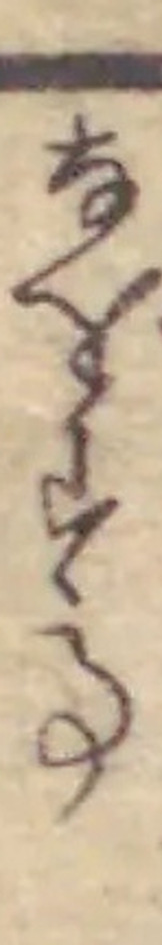なをす事
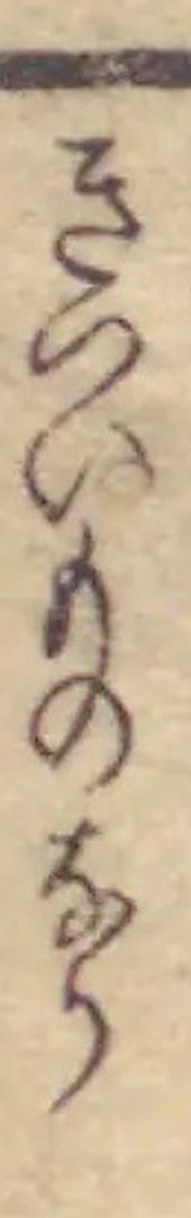きついものなり

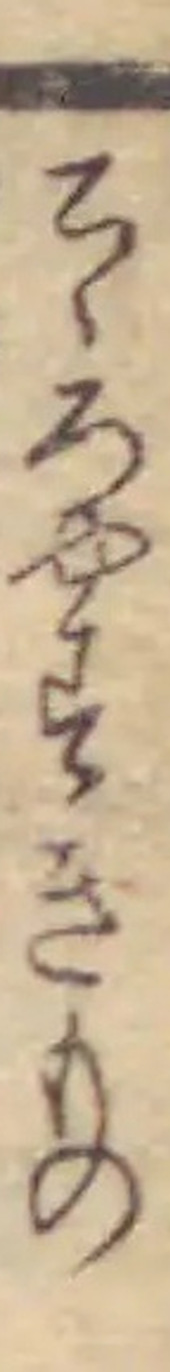こゝろやすきもの
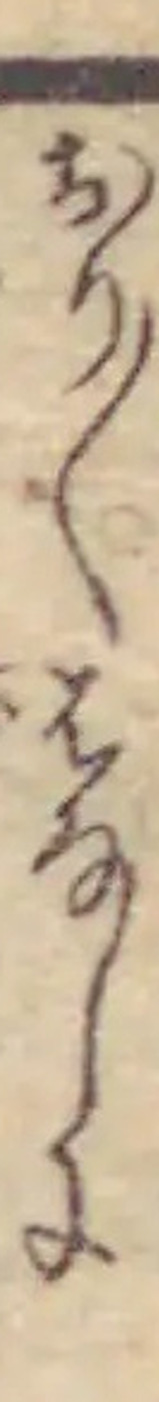おり〳〵はなしに
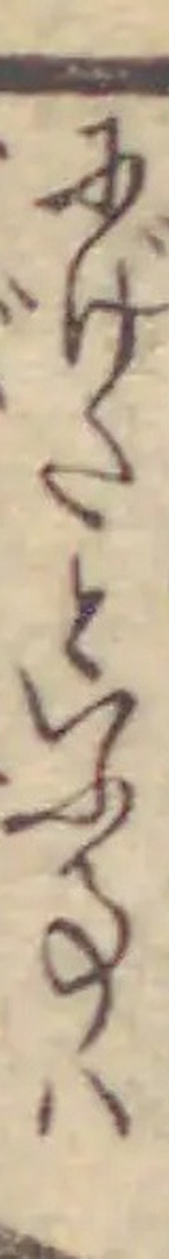にげたといふ事は
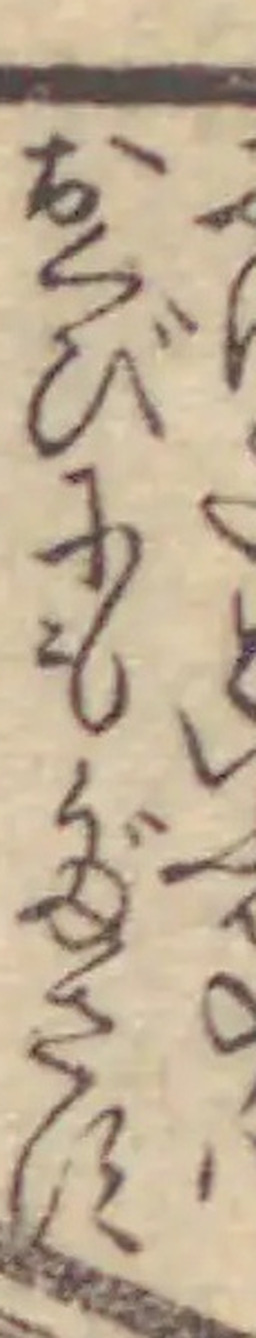おくびにもださす
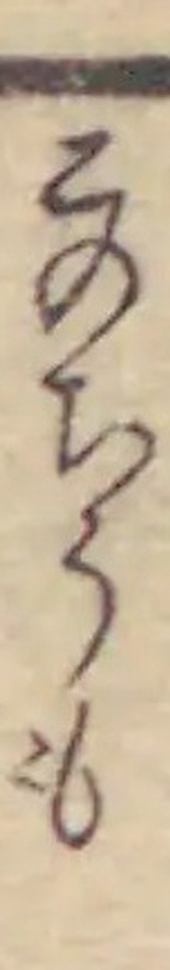このちうも
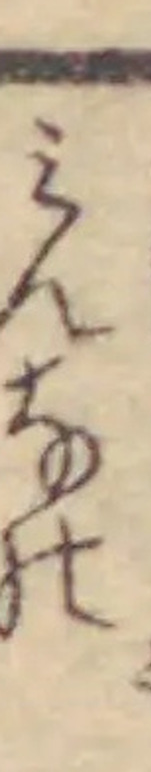みんなの
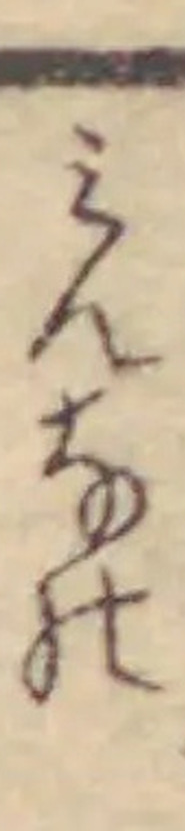みんなの
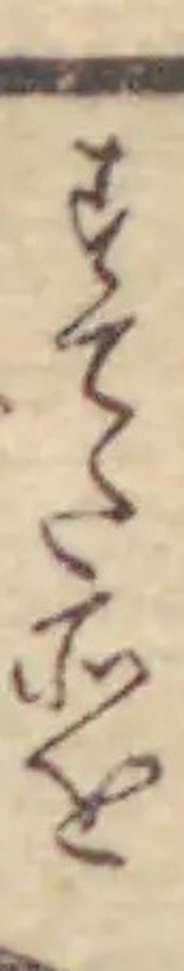すてた所を
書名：家伝寿命薬 2巻
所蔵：国立国会図書館 National Diet Library, JAPAN
